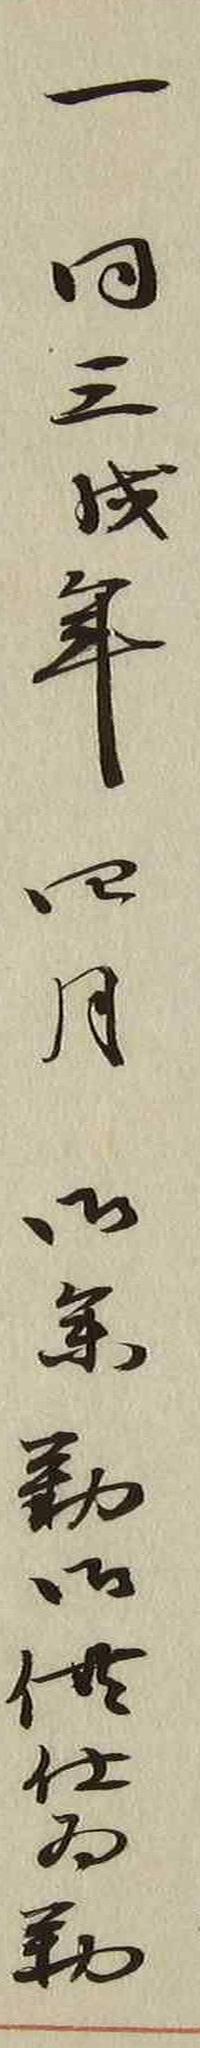一同三戌年四月御参勤御供仕り勤
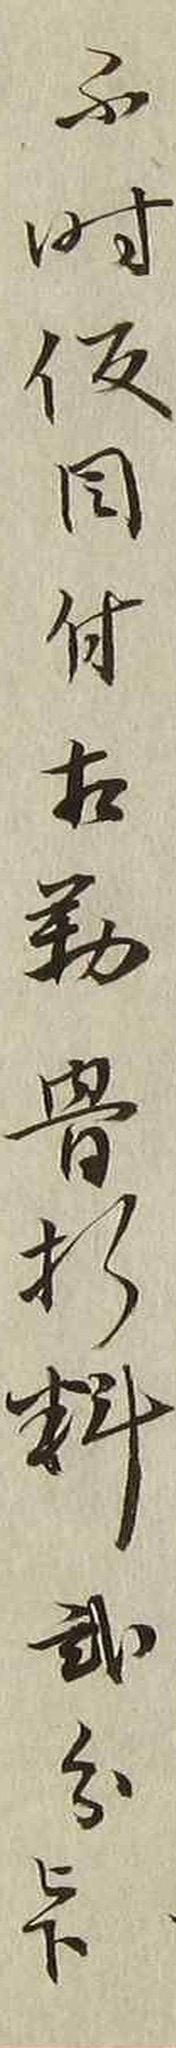ふ時仮目付相勤め骨折料弐分下し
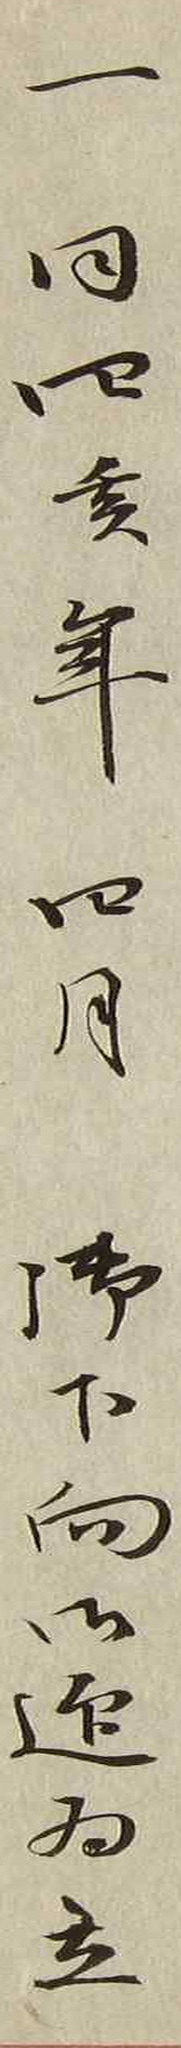一同四亥年四月御下向御迎え立ち

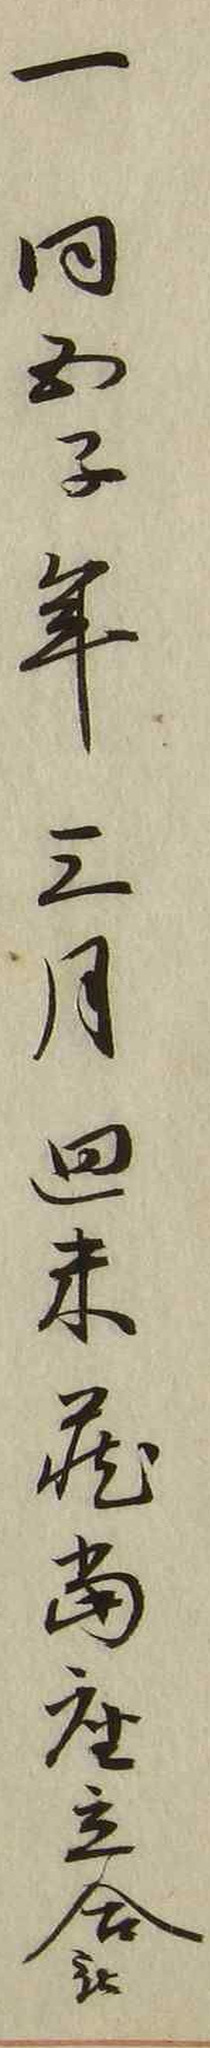一同五子年三月廻米蔵当座立会
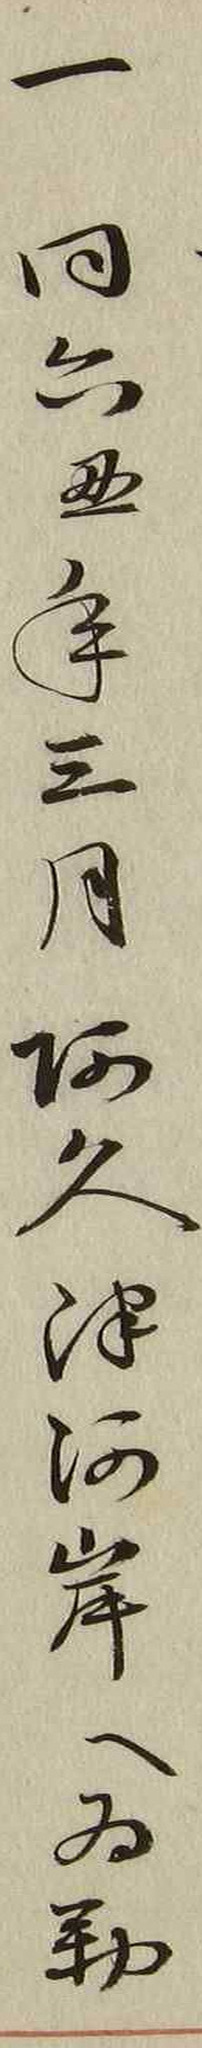一同六丑年三月河久津河岸へ勤
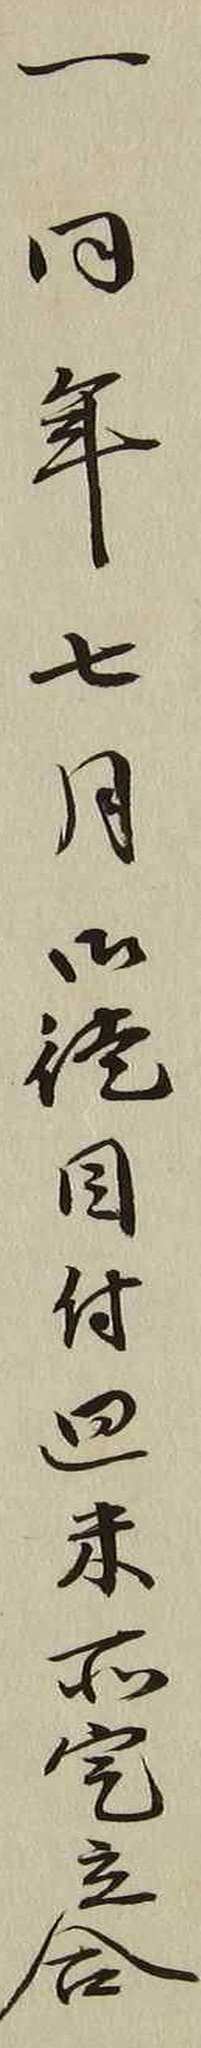一同年七月御徒目付廻米所寔立会
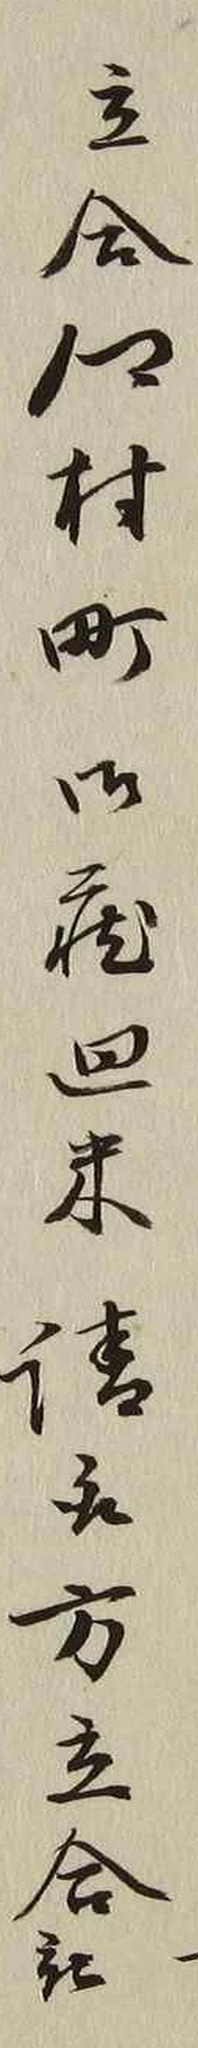立会郷村町郷蔵廻米請取方立会
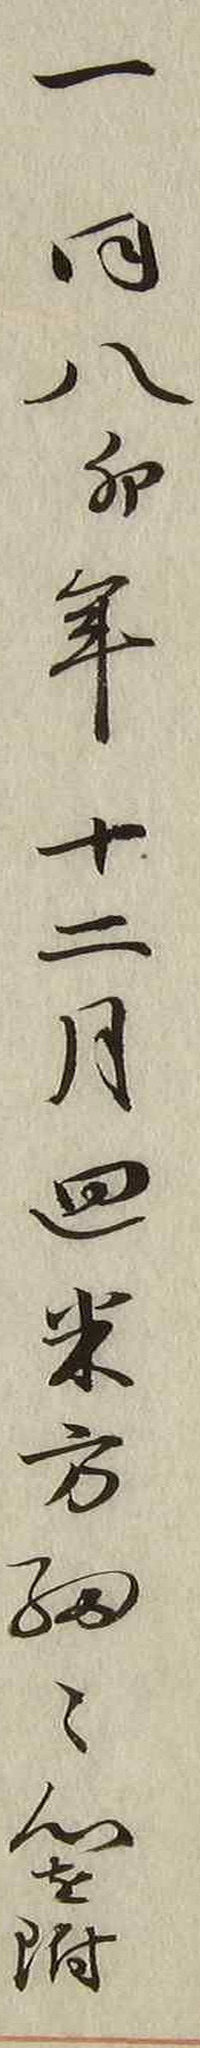一同八卯年十二月廻米方細々心を附け

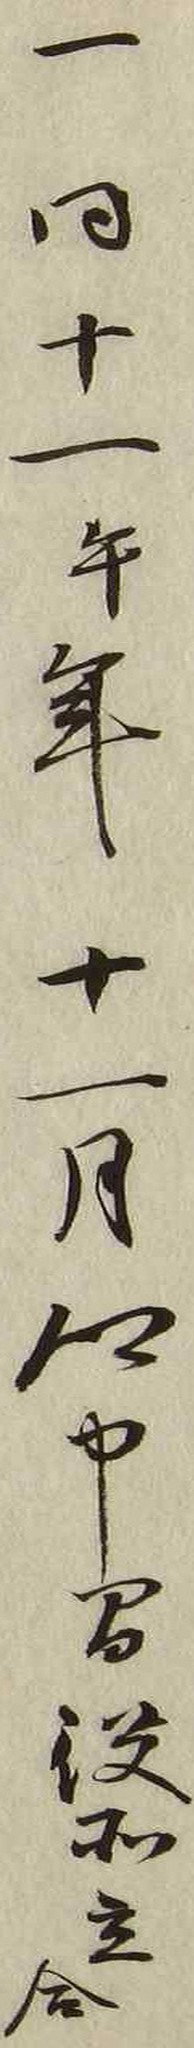一同十一午年十一月郷中間役所立会
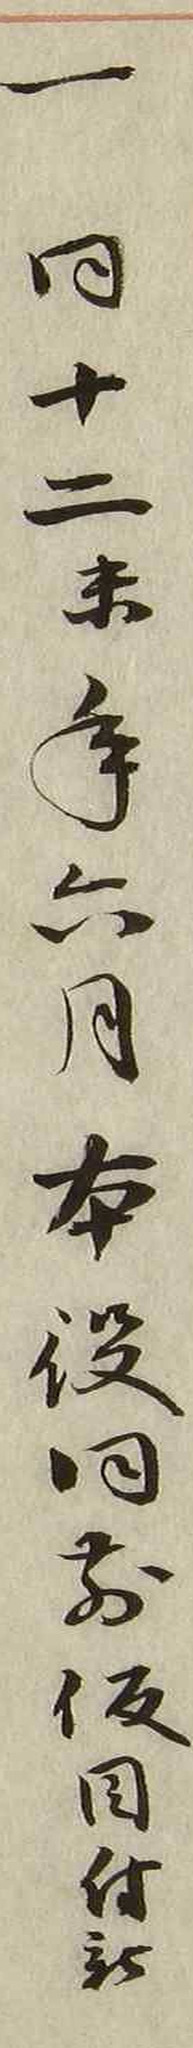一同十二未年六本役同前仮目付
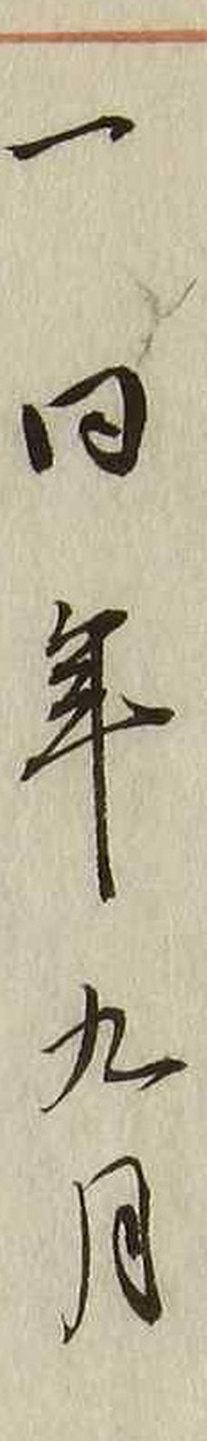一同年九月
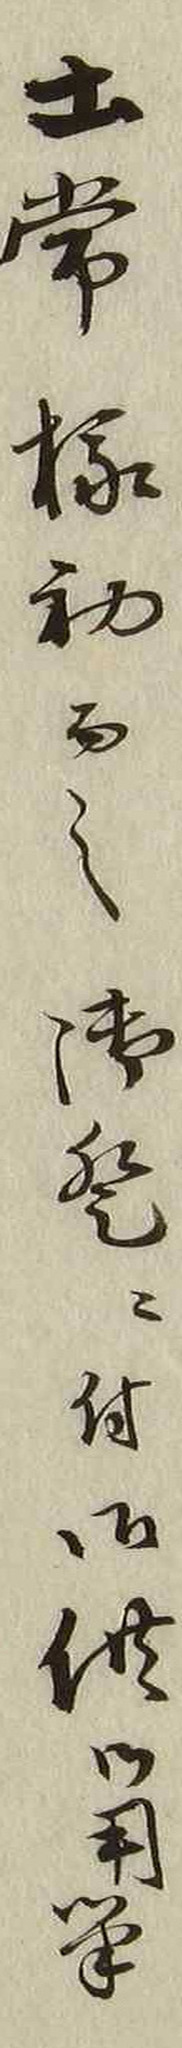土常様初めて之登りニ付き御供御用単
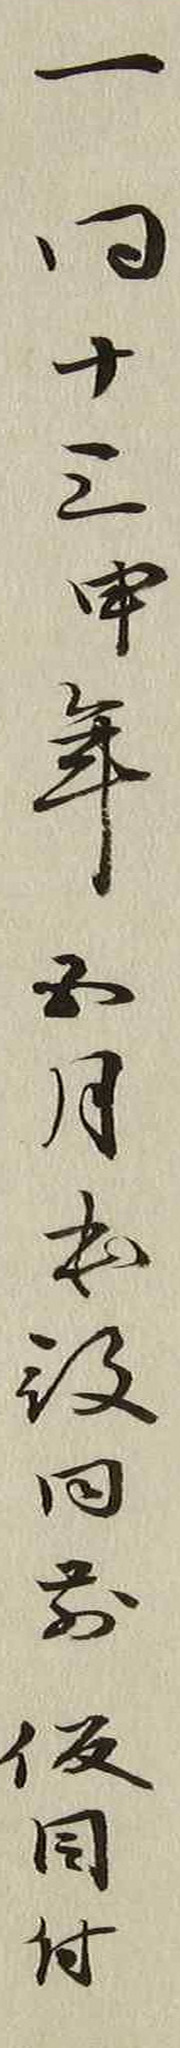一同十三申年五月本役同前仮目付
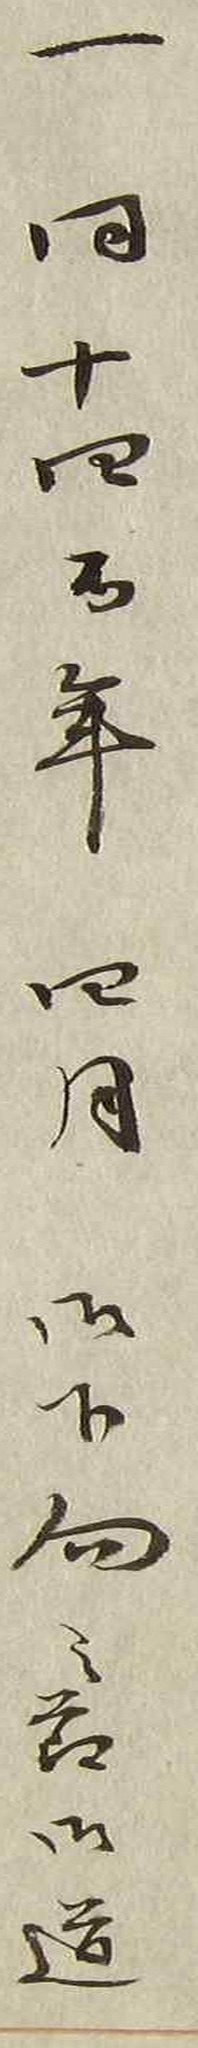一同十四酉年四月御下向之節御道

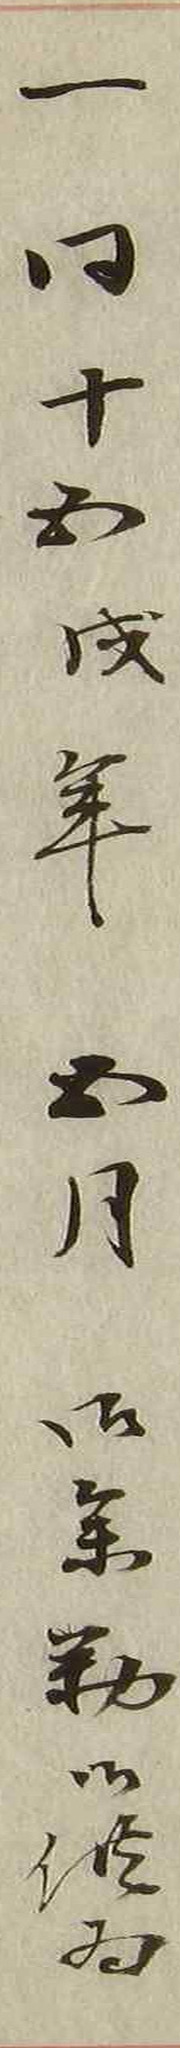一同十五戌年五月御参勤御供
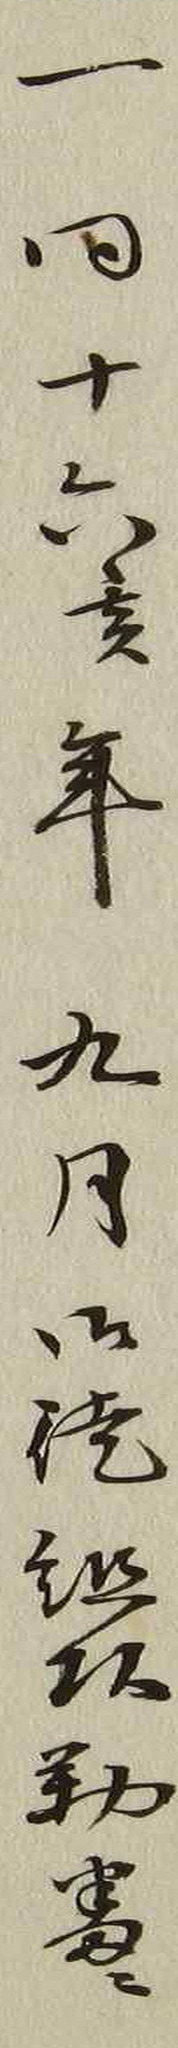一同十六亥九月御徒組頭勤番之為ニ
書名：諸士系譜　巻之16　い之部16
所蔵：会津若松市立会津図書館
